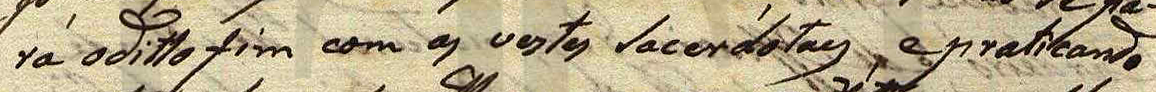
ra o ditto fim com as vestes sacerdotaes, e praticando
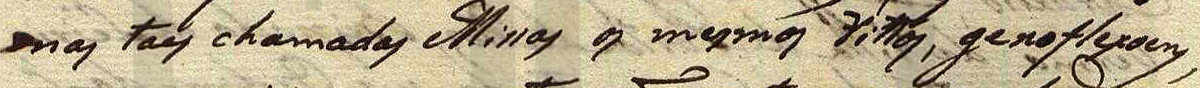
nas taes chamadas Missas os mesmos Rittos, genoflexoens,
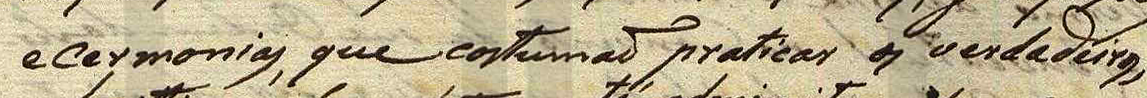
e cermonias, que costumaõ praticar os verdadeiros,
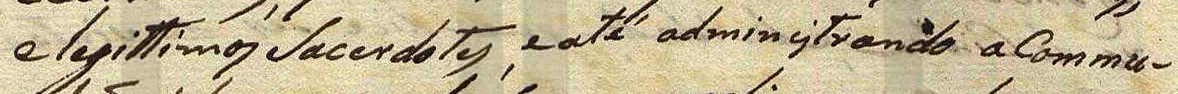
e legittimos Sacerdotes, e até administrando a Commu
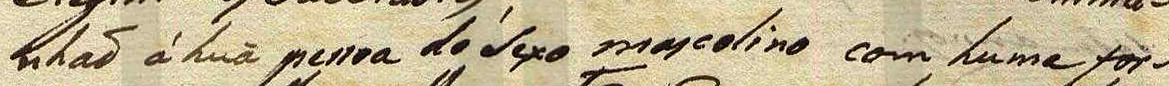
nhaõ á huā pessoa do sexo mascolino com huma for
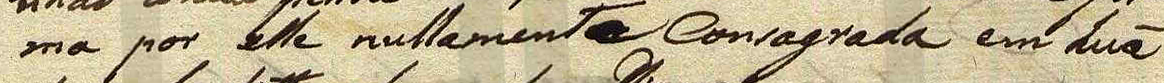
ma por elle nullamente Consagrada em huā
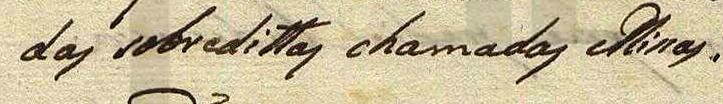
das sobredittas chamadas Missas.
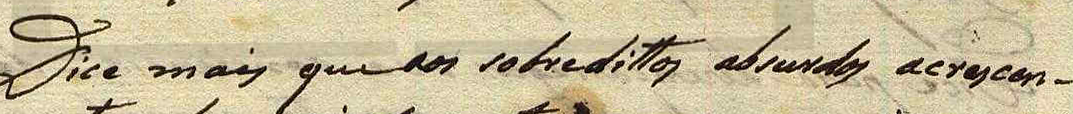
Dice mais que aos sobredittos absurdos acrescen
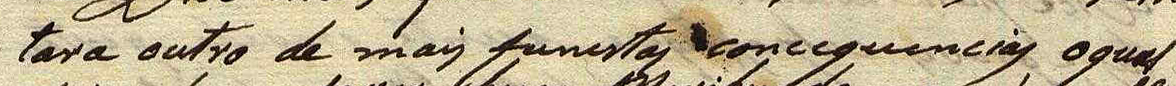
tara outro de mais funestas concequencias, o qual
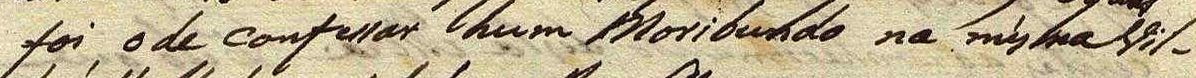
foi, o de confessar hum Moribundo na mesma Vil
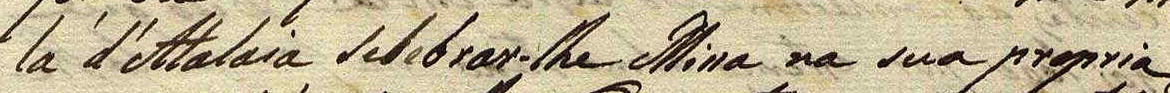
la d'Atalaia selebrar-lhe Missa na sua propria
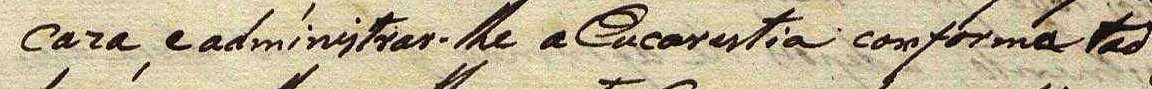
caza, e administrar-lhe a Eucarestia com forma taõ
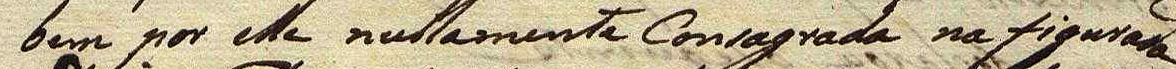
bem por elle nullamente Consagrada na figura da
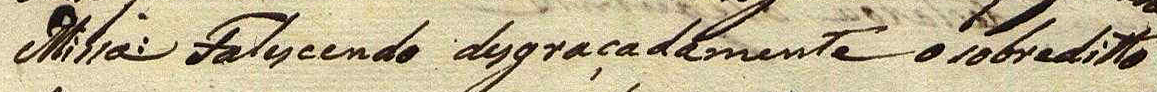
Missa: Falescendo desgraçadamente o sobreditto
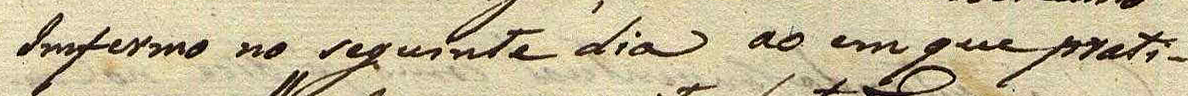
Imfermo no seguinte dia ao em que prati
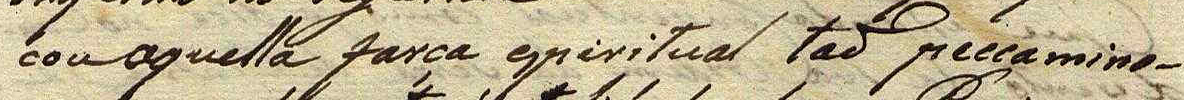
cou aquella farça espiritual tão peccamino
